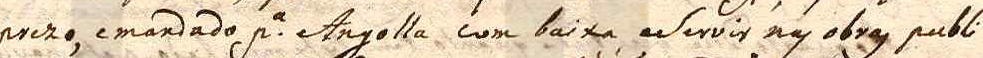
prezo, e mandado p.a Angolla com baixa, a servir nas obras publi
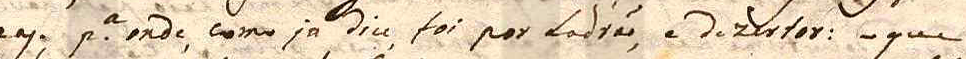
cas; p.a onde, como ja dice, foi por Ladrão, e dezertor: o que
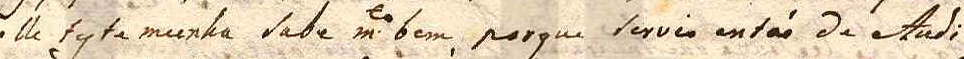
elle testemunha sabe m.to bem, porque servio então de Audi
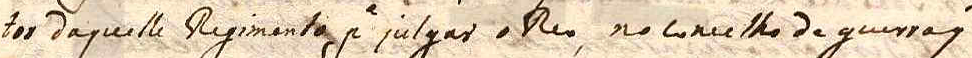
tor daquelle Regimento p.a julgar o Reo, no concelho de guerra q̄
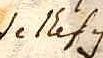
se lhefes
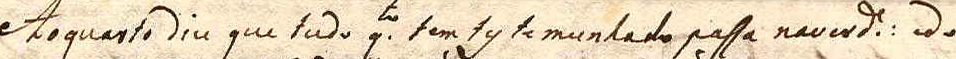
Ao quarto dice que tudo q.to tem testemunhado passa na verd.de: e do
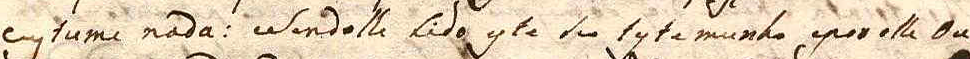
custume nada: e sendolhe Lido este seo testemunho e por ele ou
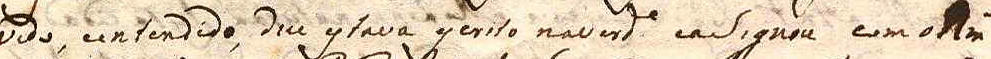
vido, e entendido, dice estava escrito na verd.e e asignou com o Rm̄.
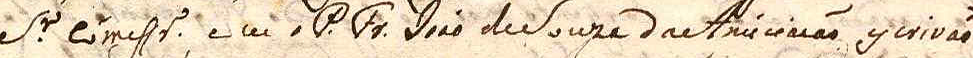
S.r Cōmissr.o, e eu o P. Fr. Ioaõ de Souza da Anúnciacão escrivaõ
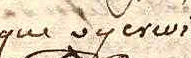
que o escrevi.
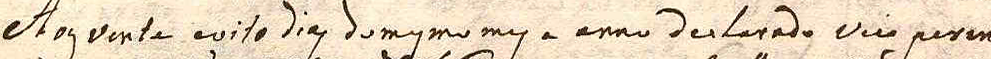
Aos vinte e oito dias do mesmo mes e anno declarado veio peran
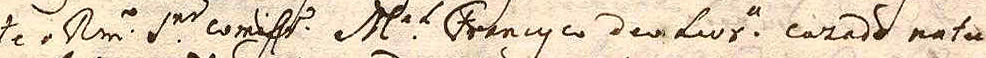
te o Rm̄. s.nr comissr.o M.al Francisco de oLivr.a cazado natu
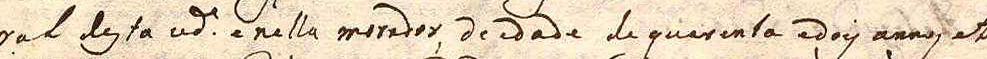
raL desta cide. e nella morador, de idade de quarenta e dois annos A
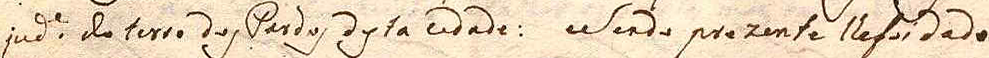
jud.e do terro dos Pardos desta cidade: e sendo prezente lhe foi dado
